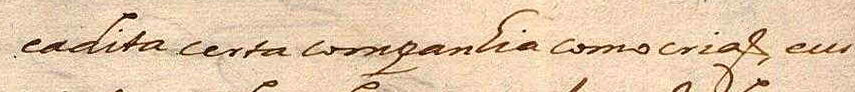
e a dita certa companhia como criaõ, e ui
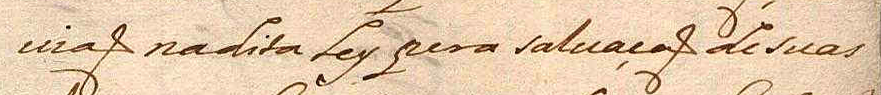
uiaõ na dita Ley pera saluaçaõ de suas
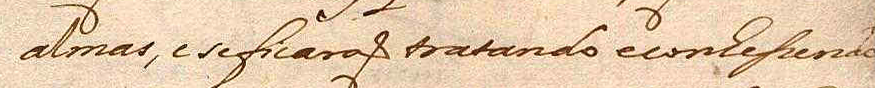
almas, e se ficaraõ tratando e conhessendo
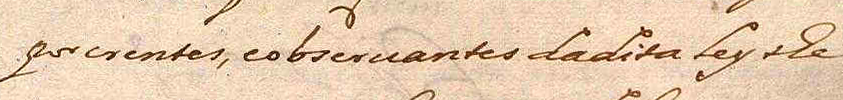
por crentes, e obseruantes da dita Ley the
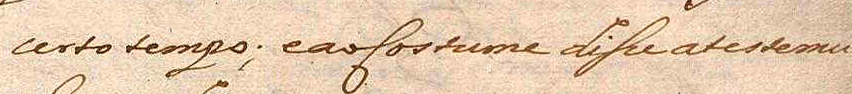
certo tempo; e ao Costume disse a testemu
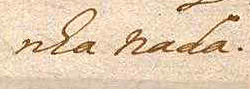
nha nada.
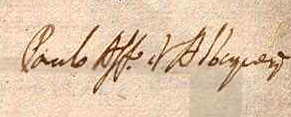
Paulo Aff.o d̄ Albuquerq̄
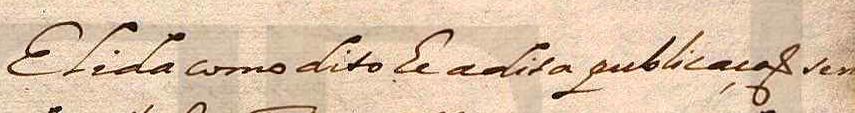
E lida como dito he a dita publicaçaõ sen
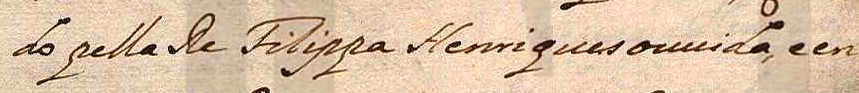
do pella Re Filippa Henriques ouuida, e en
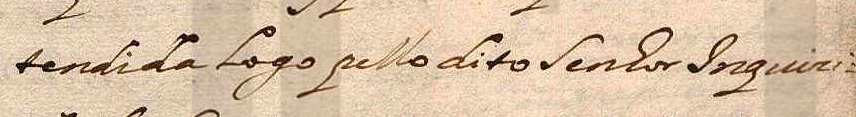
tendida Logo pello dito Senhor Inquizi
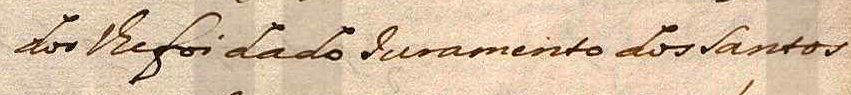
dor lhe foi dado Iuramento dos santos
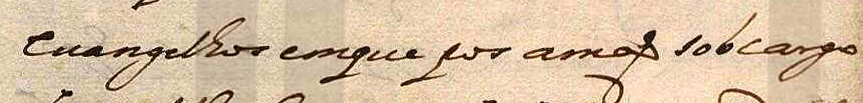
euangelhos em que pos a maõ sob cargo
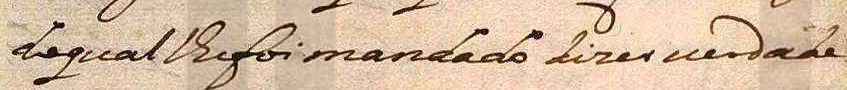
do qual lhe foi mandado dizer uerdade
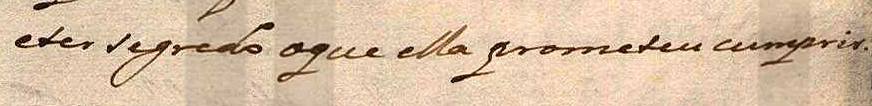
e ter segredo o que ella prometeu cumprir.
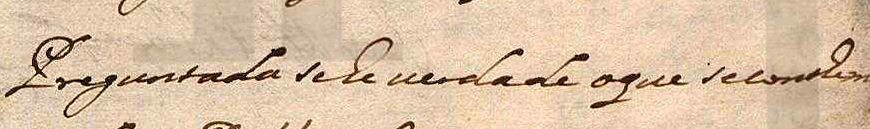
Preguntada se he uerdade o que se conthem
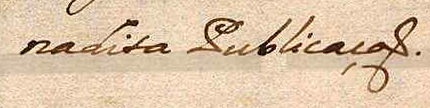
na dita Publicaçaõ.
